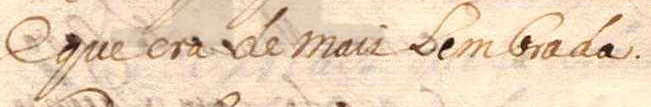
E que era de mais Lembrada.
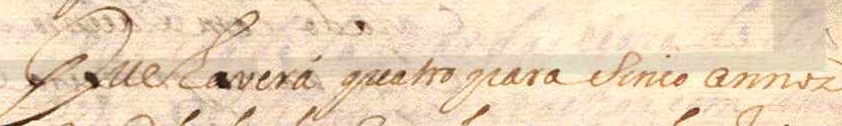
Que haverá quatro para sinco annos
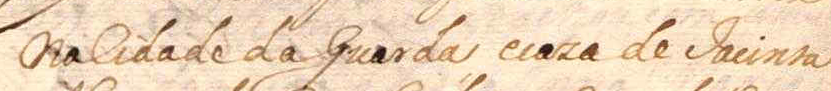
na Cidade da Guarda, e caza de Iacinta
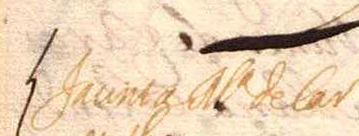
L Jacinta Ma de Car
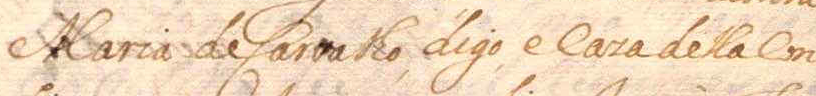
Maria de Carvalho, digo, e caza della con
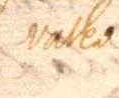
valho
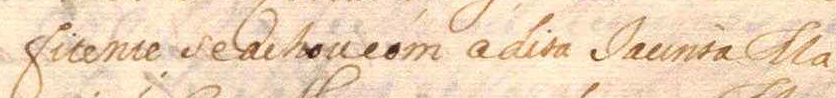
fitente, se achou com a dita Iacinta Ma
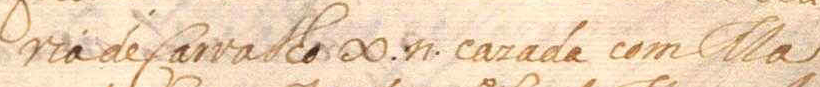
ria de Carvalho x. n. cazada com Ma
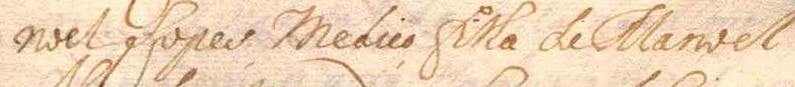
noel Lopes, Medico, filha de Manoel
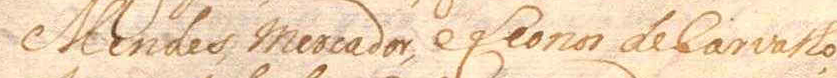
Mendes, mercador, e Leonor de Carvalho
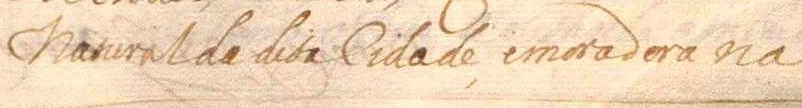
Natural da dita Cidade, e moradora na
